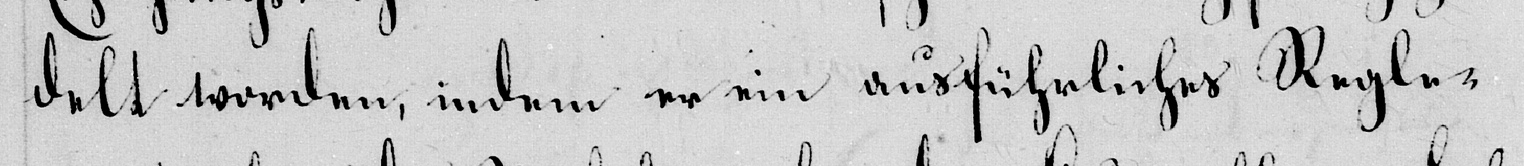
delt worden, indem er ein ausführliches Regle¬
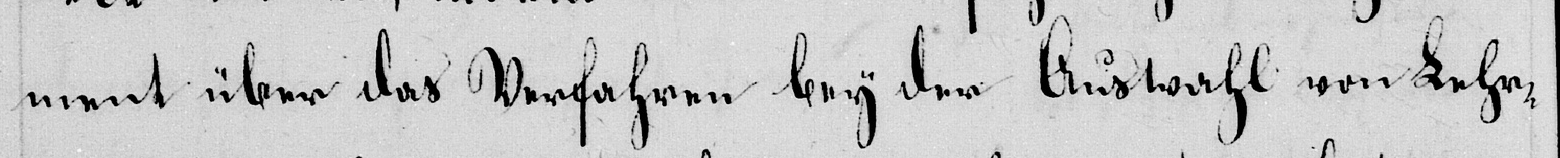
ment über das Verfahren bey der Auswahl von Lehr¬
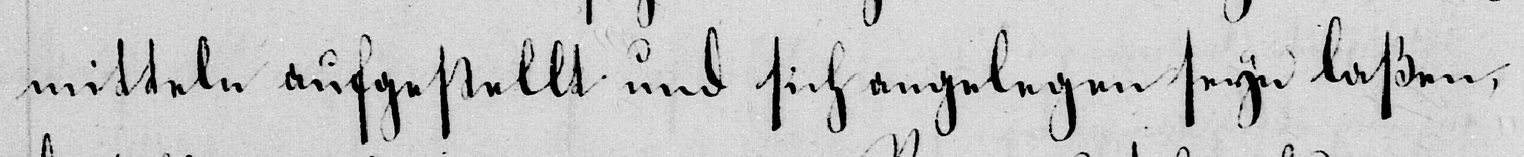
mitteln aufgestellt und sich angelegen seyn laßen,
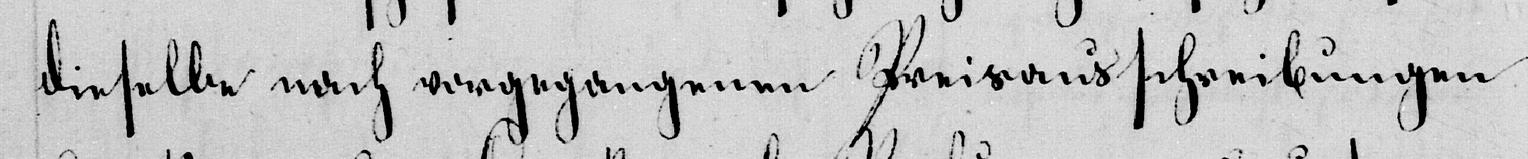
dieselbe nach vorgegangenen Preisausschreibungen
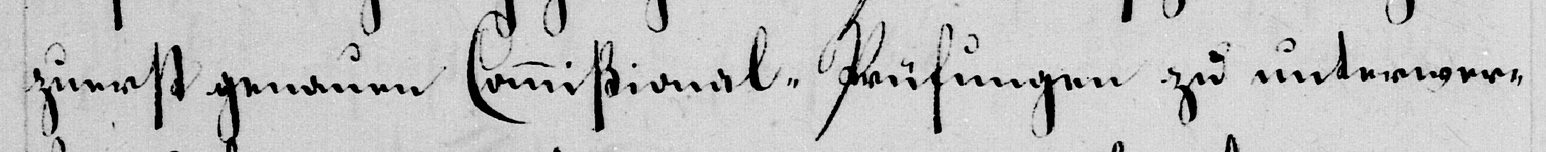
zuerst genauen Comißional-Prüfungen zu unterwer¬
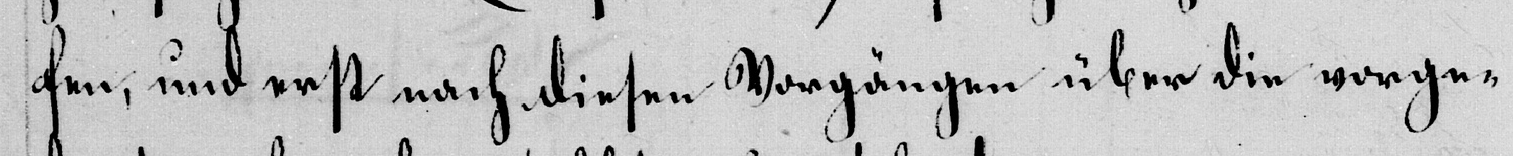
fen, und erst nach diesen Vorgängen über die vorge¬
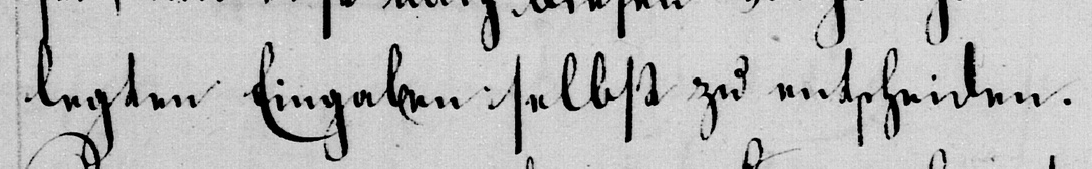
legten Eingaben selbst zu entscheiden.
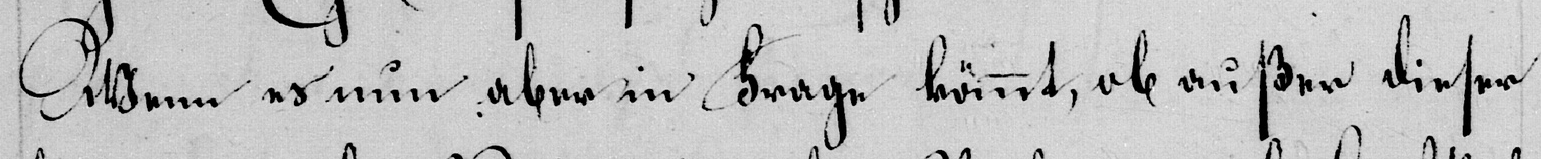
Wenn es nun aber in Frage kömmt, ob außer dieser
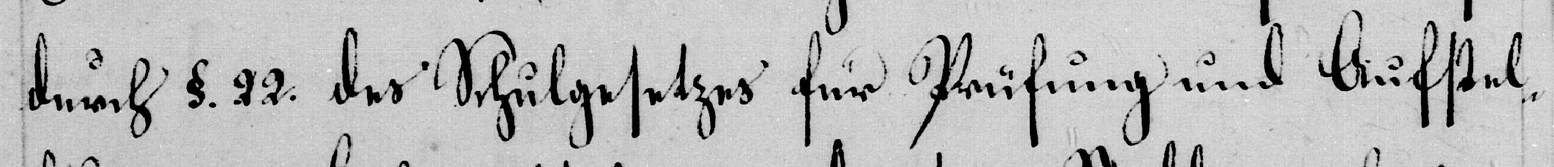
durch §. 22. des Schulgesetzes für Prüfung und Aufstel¬
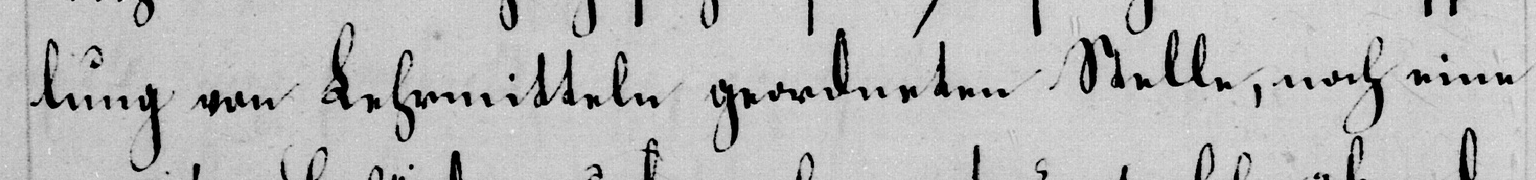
lung von Lehrmitteln geordneten Stelle, noch eine
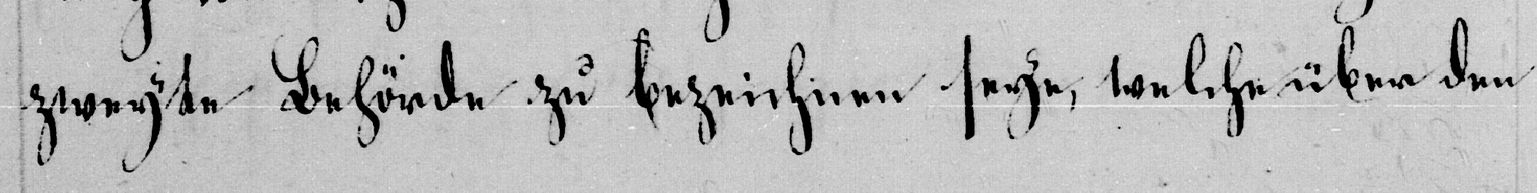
zweyte Behörde zu bezeichnen seye, welche über den
